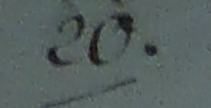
20.
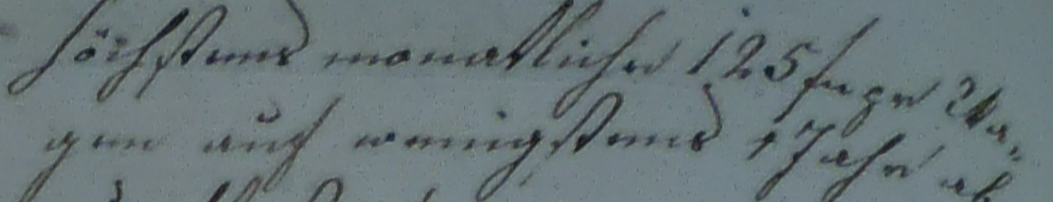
höchstens monatliche 125 fn pr Wa¬
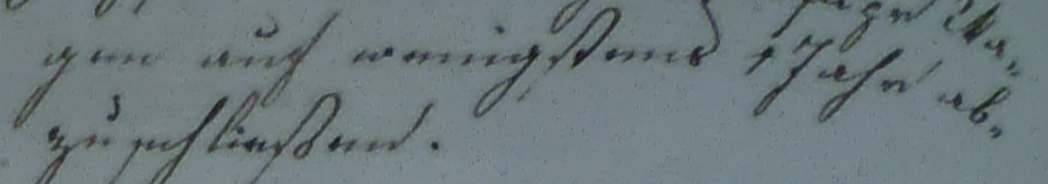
gen auf wenigstens 1 Jahr ab¬
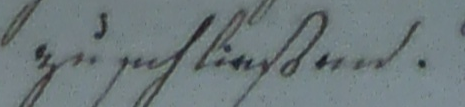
zuschließen.
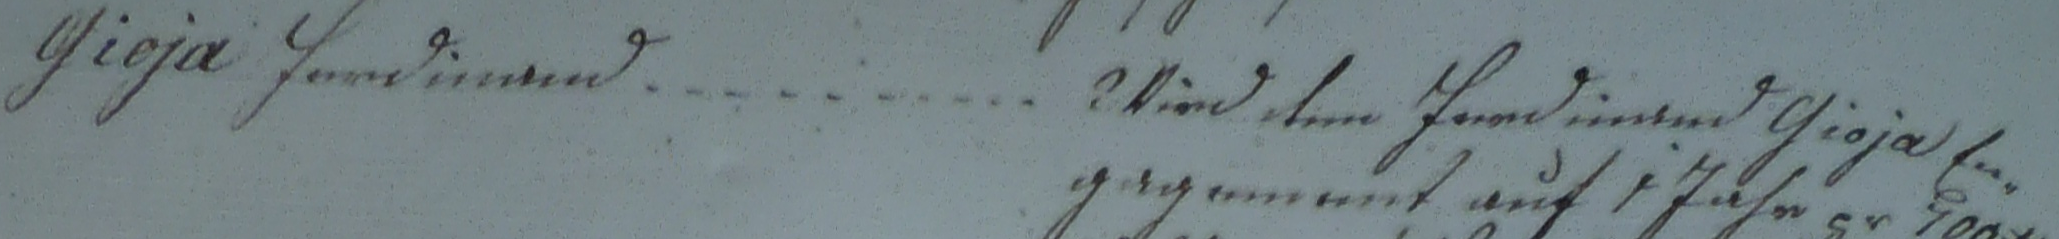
Gioja Ferdinand ………. Wird dem Ferdinand Gioja En¬
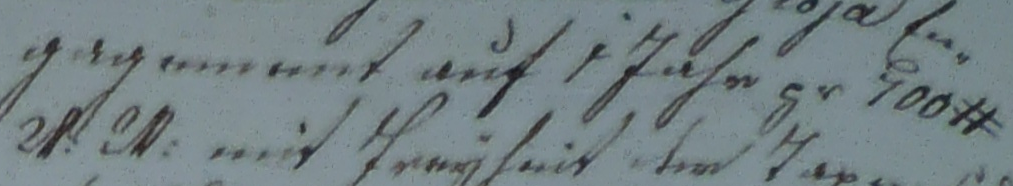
gagement auf 1 Jahr pr 700#
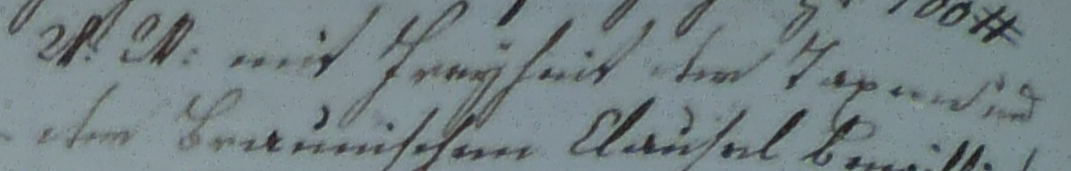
W:W: mit Freyheit der Taxen und
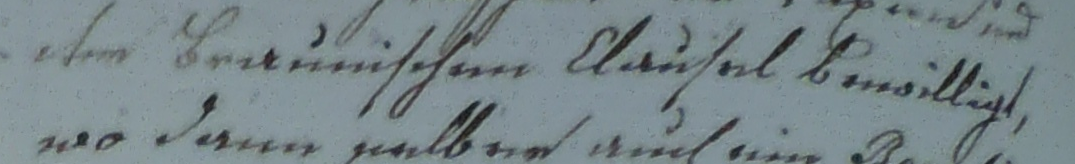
der Braunischen Clausel bewilligt,
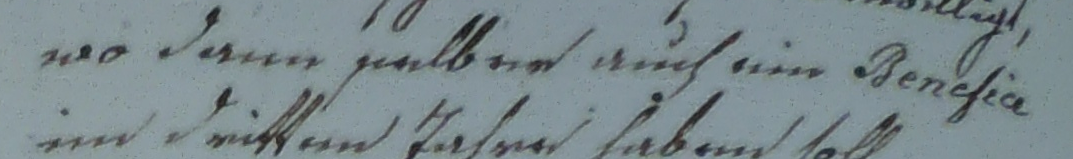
wo dann selber auch ein Benefice
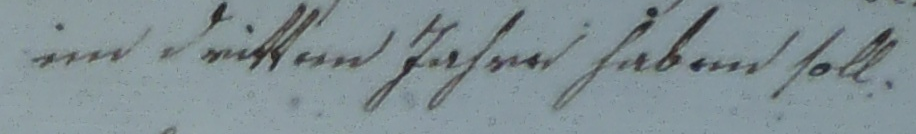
im dritten Jahre haben soll.
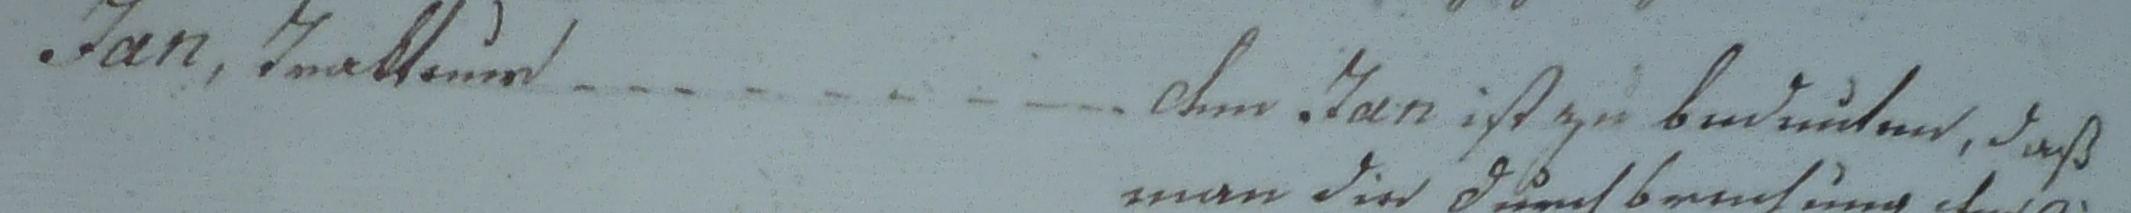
Jan, Trakteur ……….. Dem Jan ist zu bedeuten, daß
